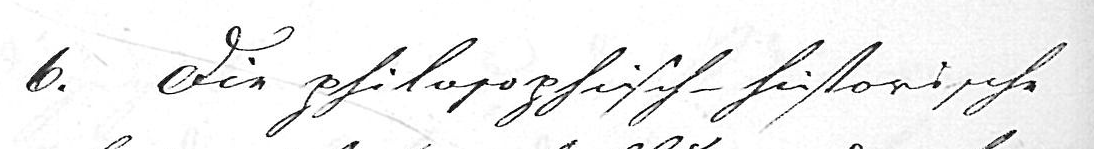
b. Die philosophisch-historische
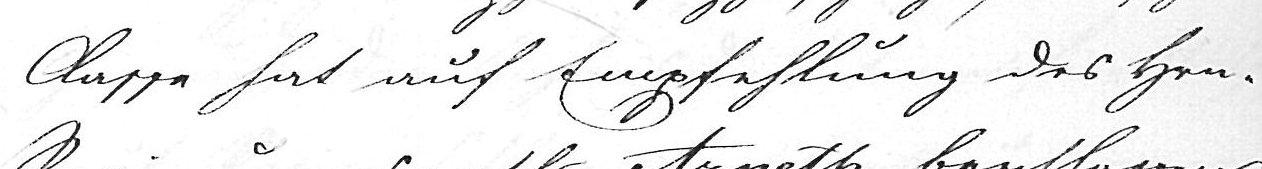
Classe hat auf Empfehlung des Hrn.
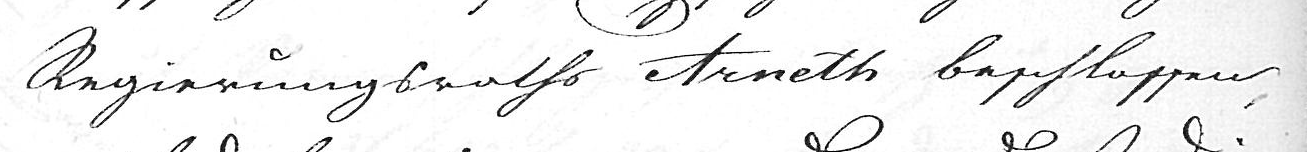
Regierungsraths Arneth beschlossen,
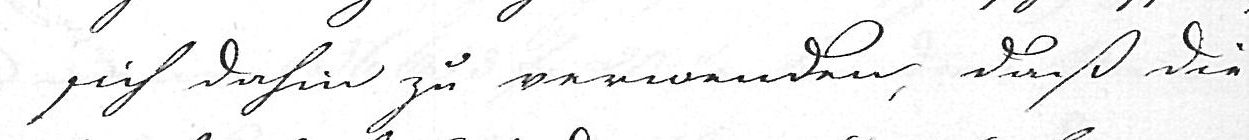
sich dahin zu verwenden, daß die
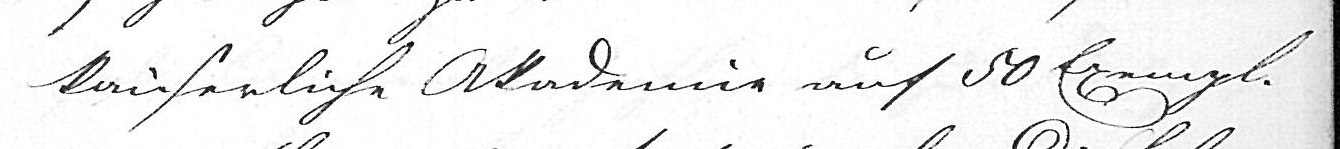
kaiserliche Akademie auf 50 Exempl.
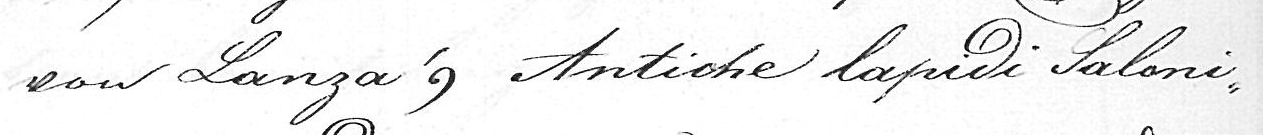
von Lanza's Antiche lapidi Saloni-
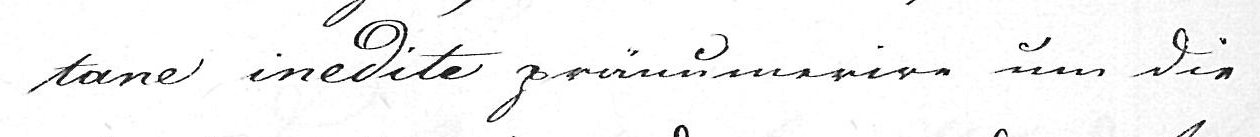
tane inedite pränumerire um die
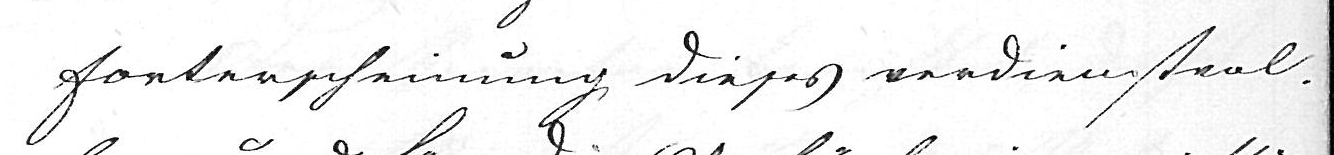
Forterscheinung dieses verdienstvol-
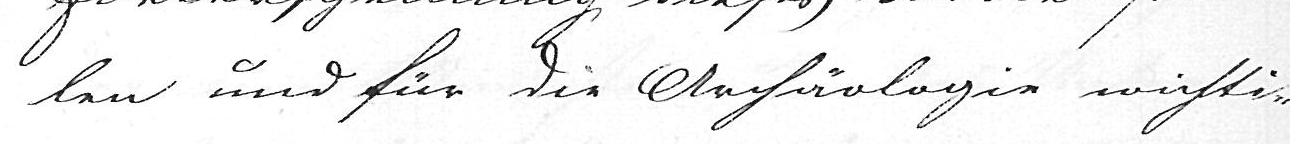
len und für die Archäologie wichti-
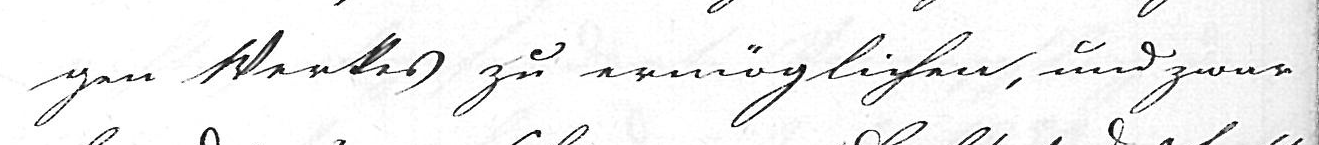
gen Werkes zu ermöglichen, und zwar
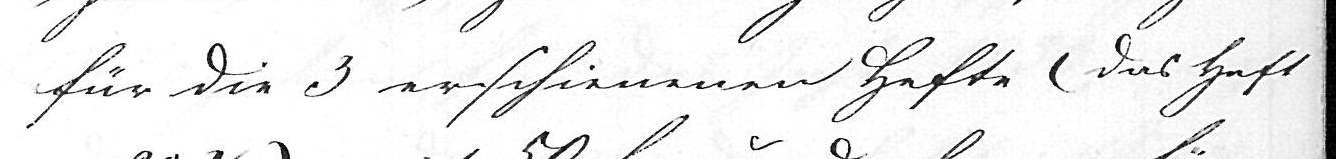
für die 3 erschienenen Hefte (das Heft
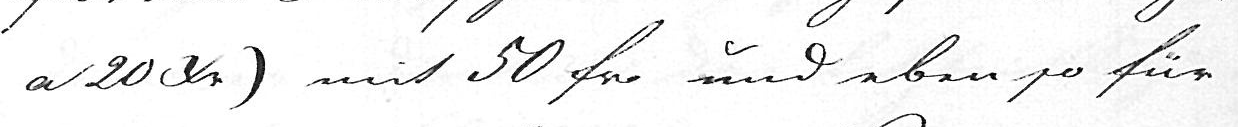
a 20 Kr) mit 50 fr und eben so für
